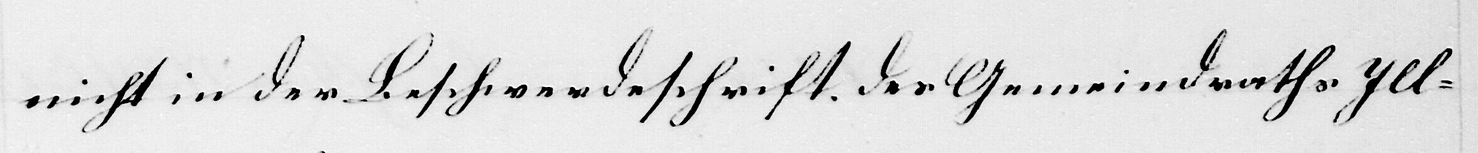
nicht in der Beschwerdeschrift des Gemeindraths Ill¬
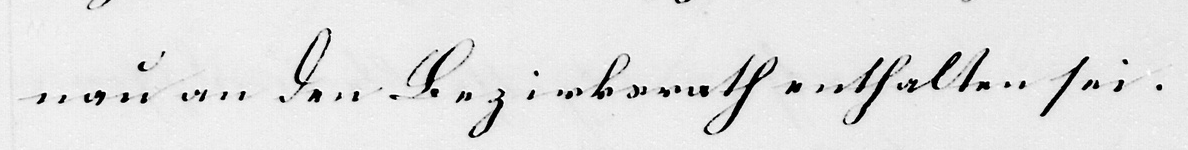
nau an den Bezirksrath enthalten sei.
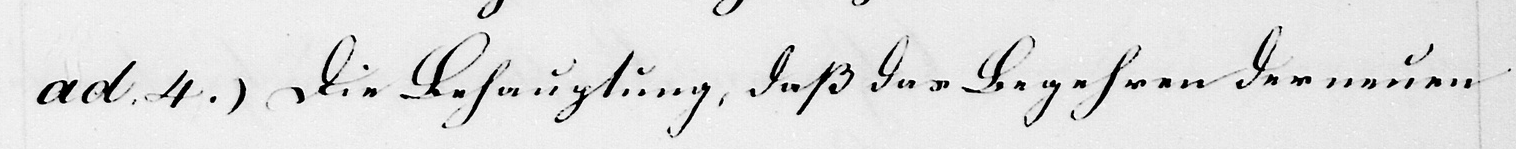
ad. 4.) Die Behauptung, daß das Begehren der neuen
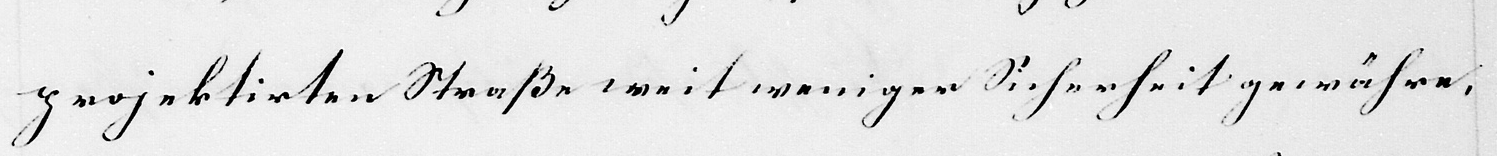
projektirten Straße weit weniger Sicherheit gewähre,
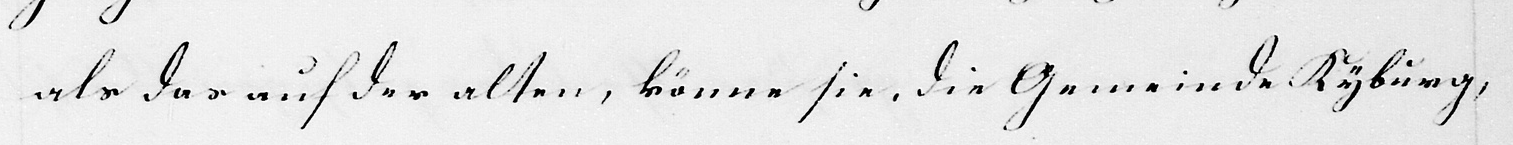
als das auf der alten, könne sie, die Gemeinde Kyburg,
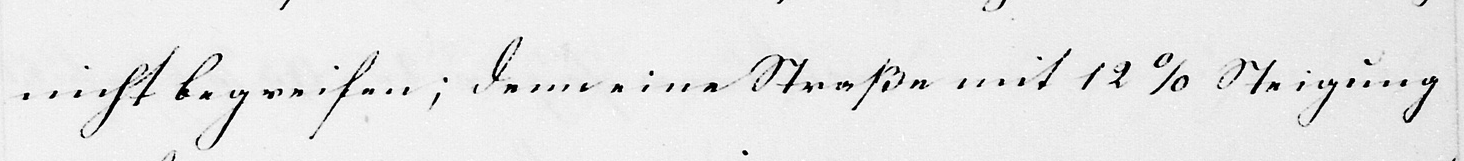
nicht begreifen; denn eine Straße mit 12 % Steigung
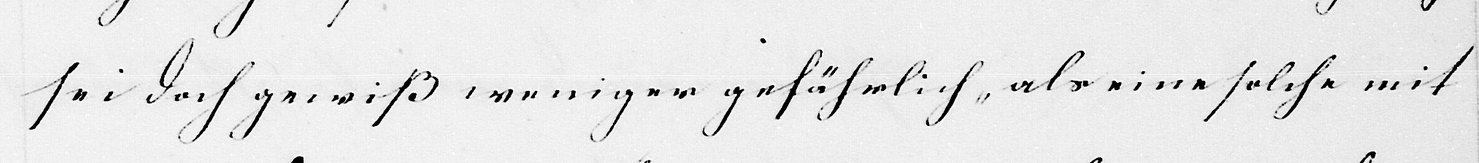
sei doch gewiß weniger gefährlich, als eine solche mit
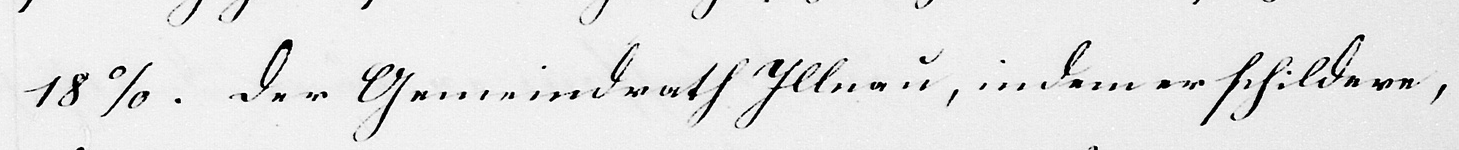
18 %. Der Gemeindrath Illnau, indem er schildere,
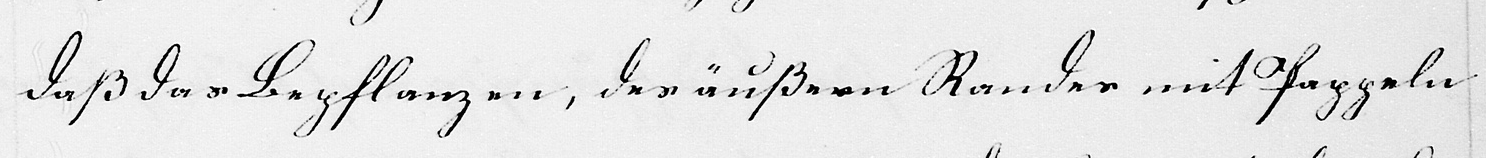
daß das Bepflanzen, des äußern Randes mit Pappeln
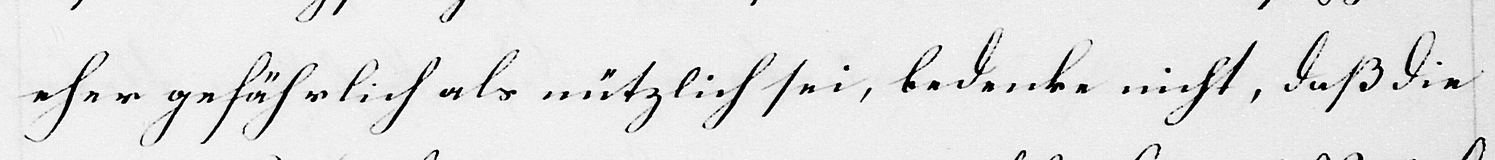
eher gefährlich als nützlich sei, bedenke nicht, daß die
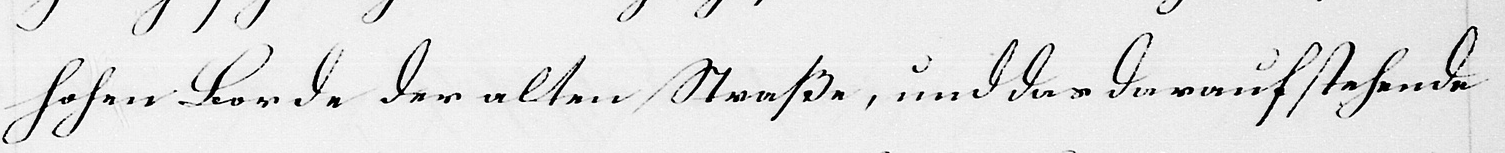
hohen Borde der alten Straße, und das darauf stehende
